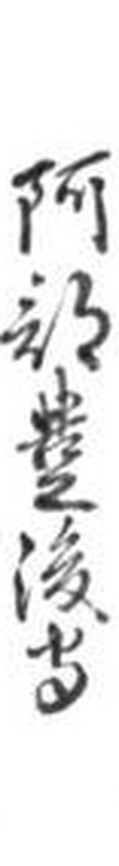阿部豊後守
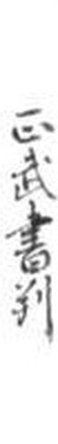正武書判
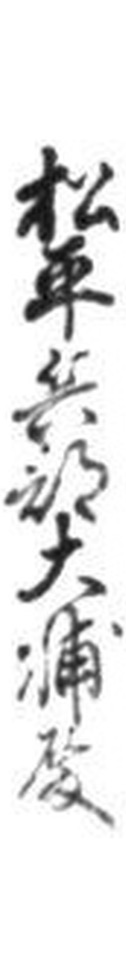松平兵部大輔殿
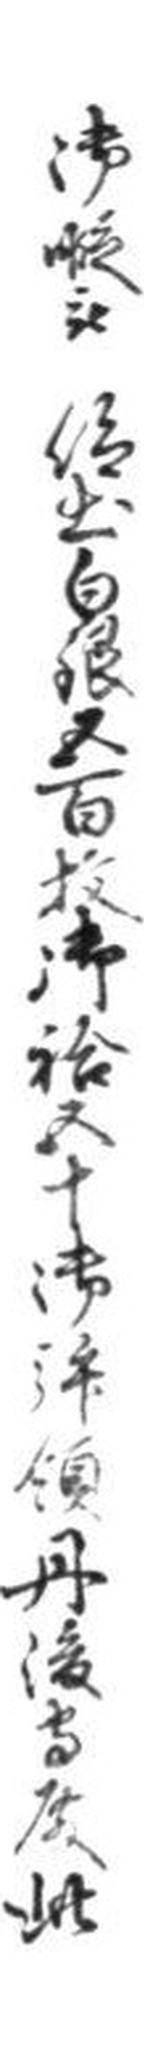御暇被仰出白銀五百枚御袷五十御拝領丹後守殿此
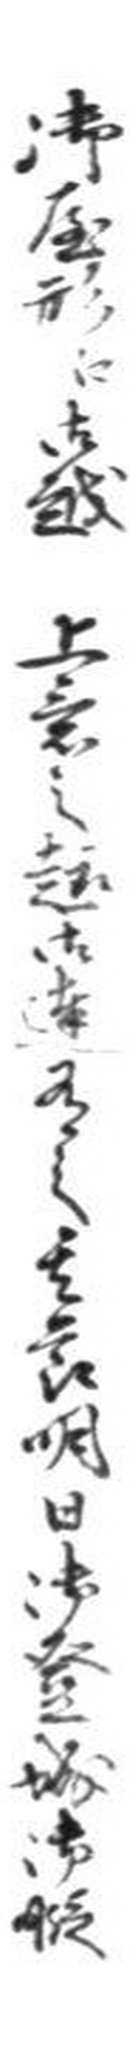御屋形江御越上意之趣御達有之其節明日御登城御暇
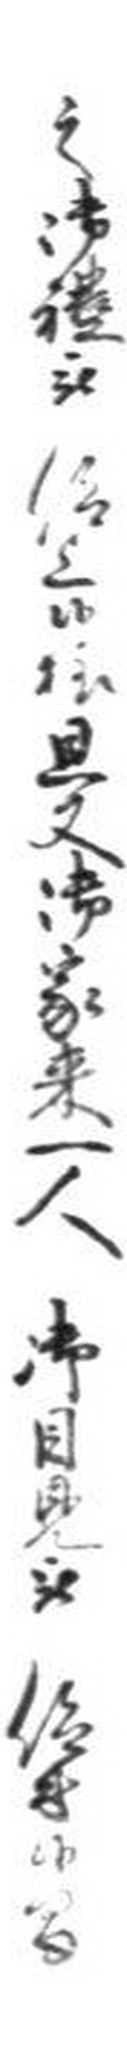之御礼被仰上候様且又御家来一人御目見被仰付候間
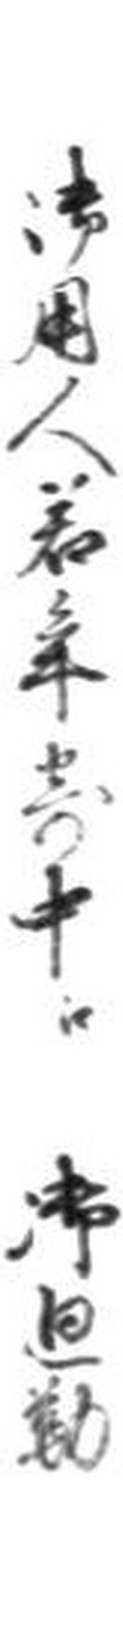御用人若年寄中江御廻勤
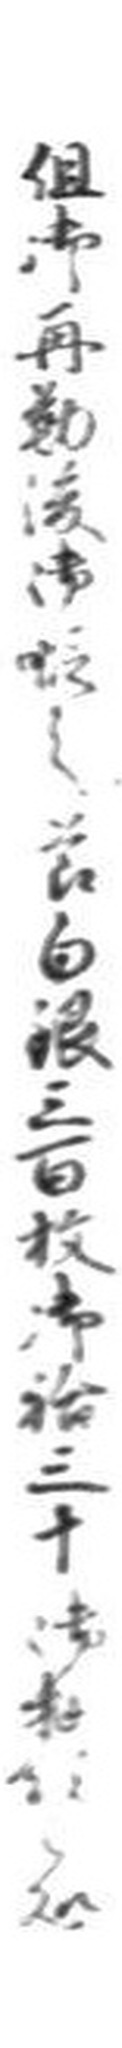但御再勤後御暇之節白銀三百枚御袷三十御拝領之処
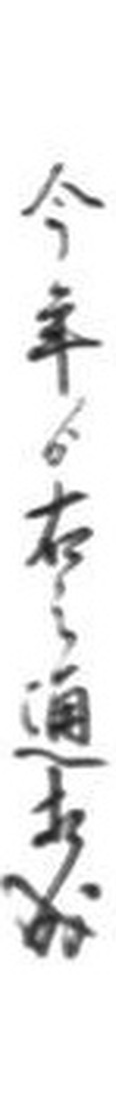今年ゟ右之通相成
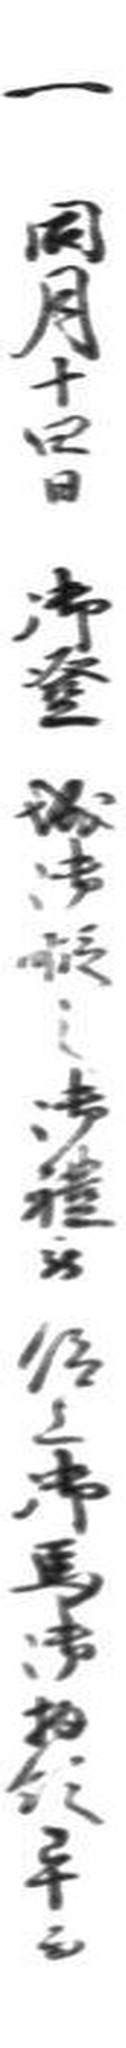一同月十四日御登城御暇之御礼被仰上御馬御拝領畢而
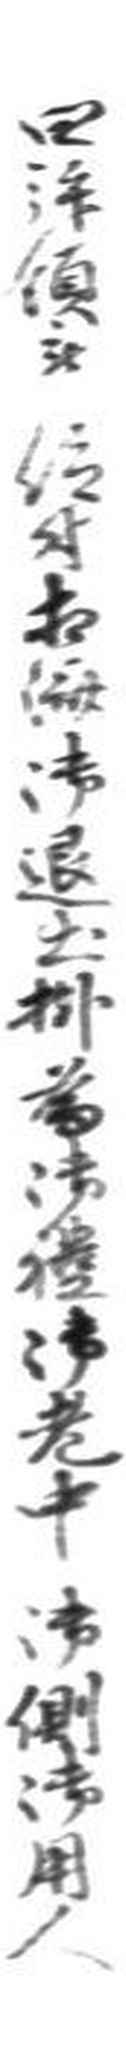四拝領被仰付相済御退出掛為御礼御老中御側御用人
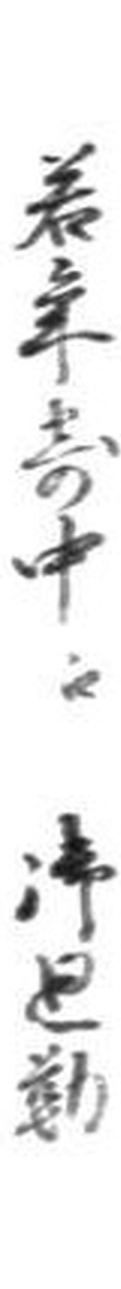若年寄中江御廻勤
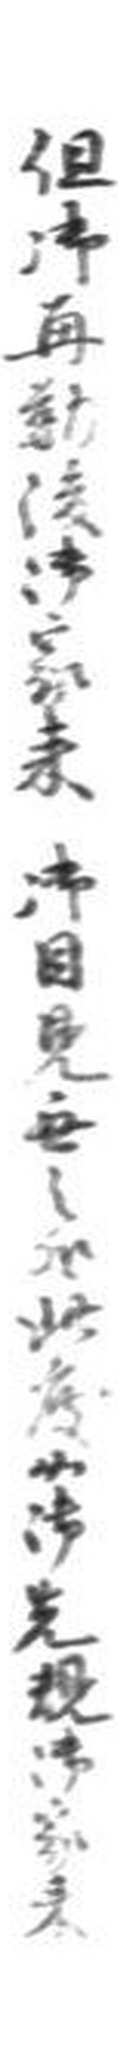但御再勤後御家来御目見無之処此度如御先規御家来

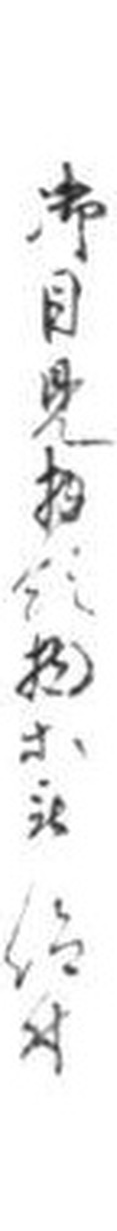御目見拝領物等被仰付
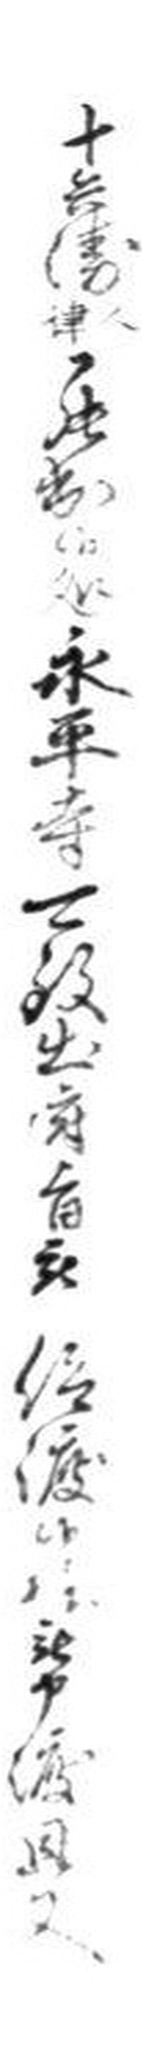律罷出候処永平寺可致出府旨被仰渡候様被申渡且又
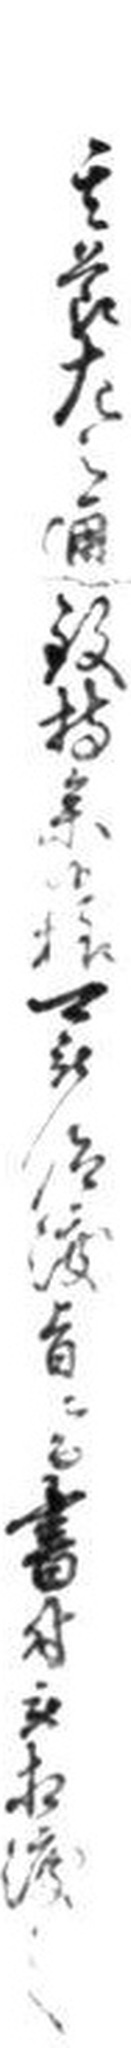其節左之通致持参候様可被仰渡旨ニ而書付被相渡之
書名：家譜 二十二 吉品公 従元禄十五年到同十六年
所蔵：福井県文書館 Fukui Prefectural Archives
